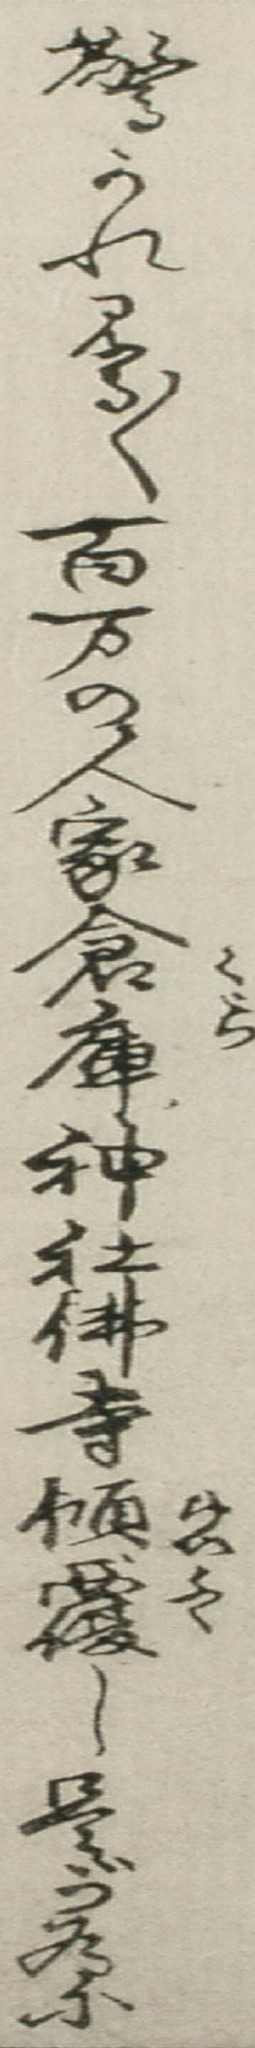驚かれ見る〳〵百万の人家倉庫神社仏寺傾覆し是が為に
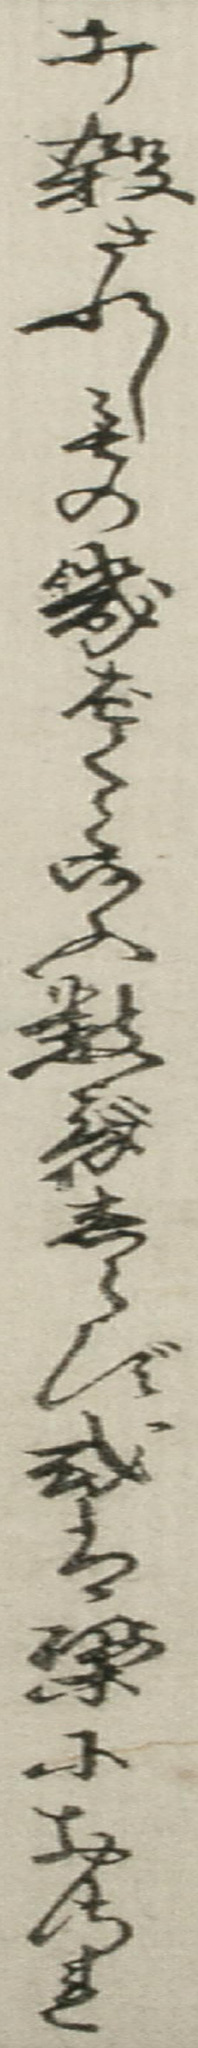打ち殺されしもの幾ばくといふ数をしらず或は梁におされ
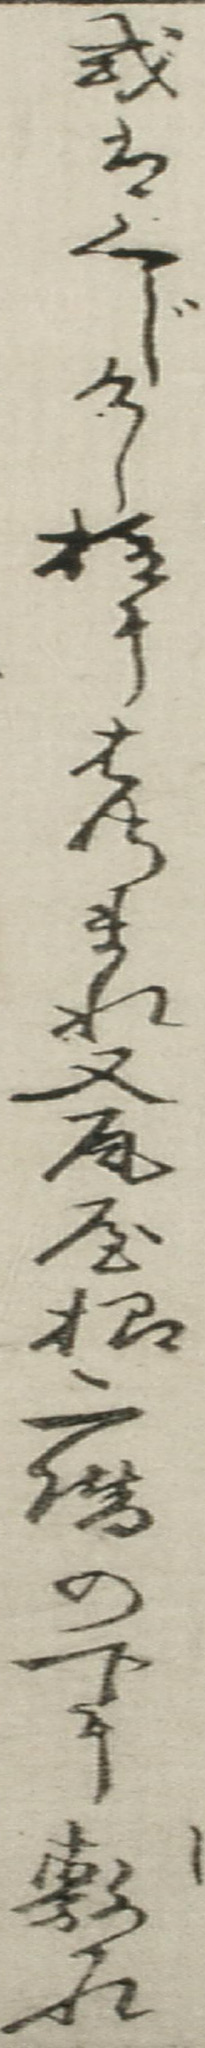或はくじけし柱にはさまれ又瓦屋根二階の下に敷かれ
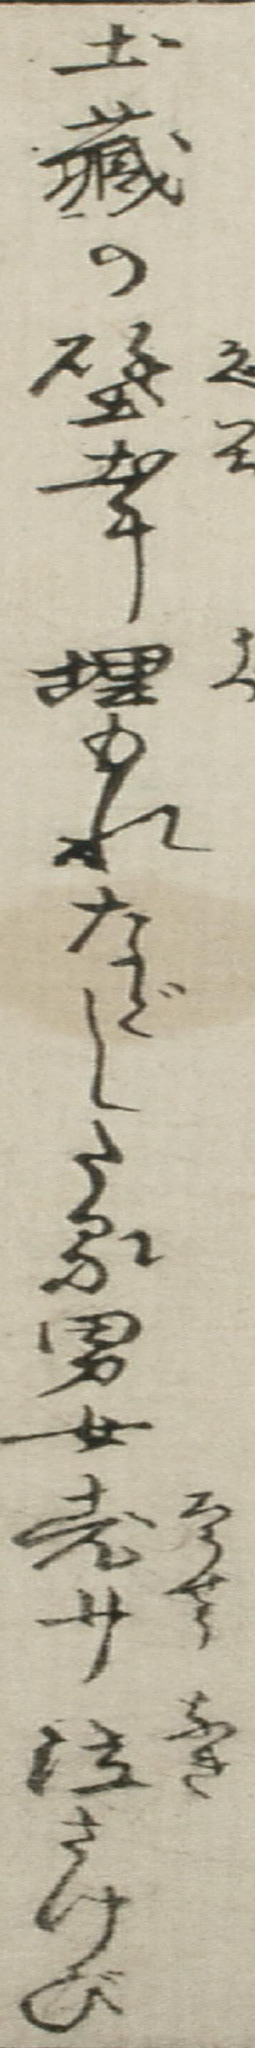土蔵の壁土に埋もれなどしたる男女老少泣さけび
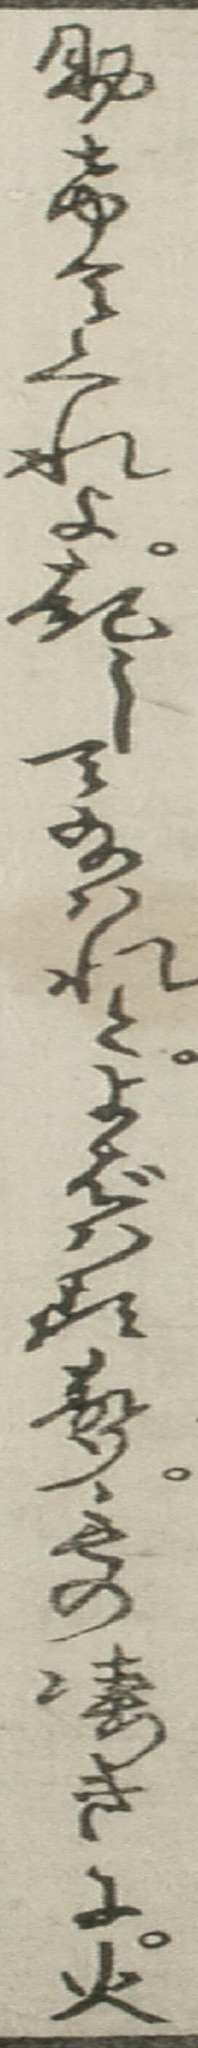助けてくれよ。起して給はれと。よばはる声。もの凄きに。火
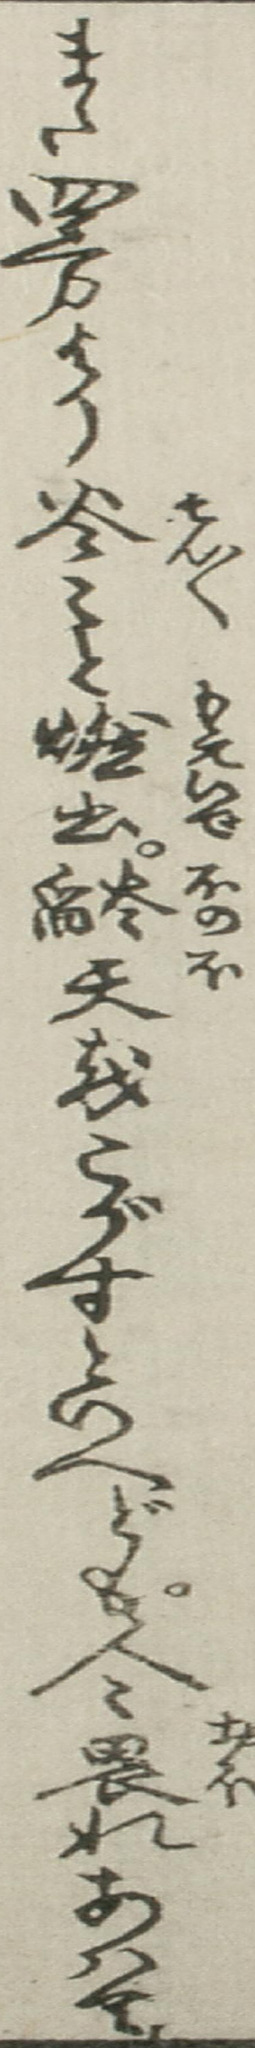また四方より炎々と燃出。燄天をこがすといへども。人々畏れあはて
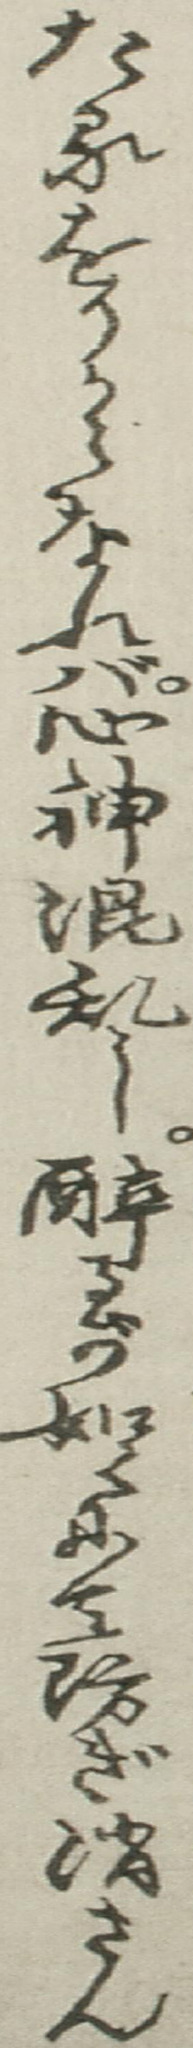たるおりからなれば。心神混乱し。酔るが如くにて防ぎ消さん
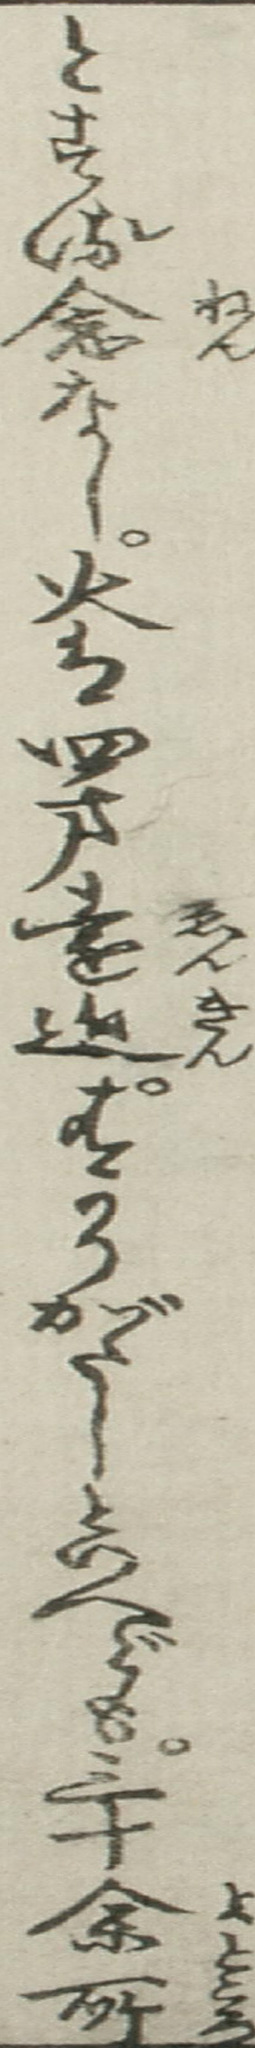とする念なし。火は四方遠近。はかりがたしといへども。三十余所
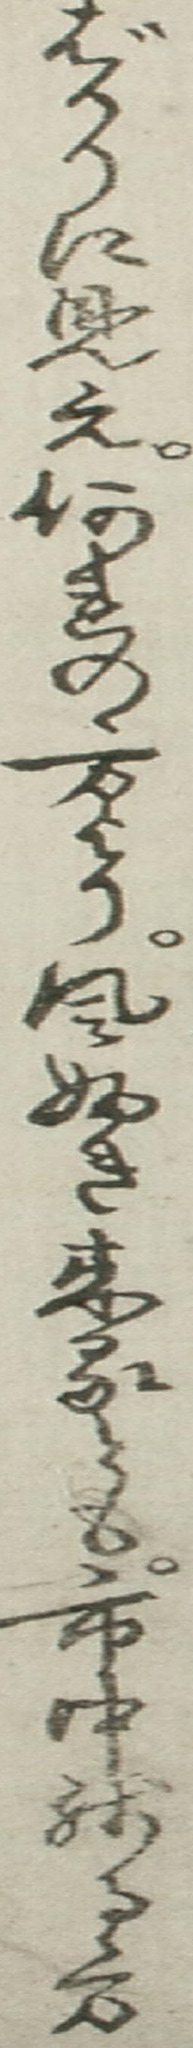ばかりに見え。何れの方より。風ふき来るとも。市中残る方
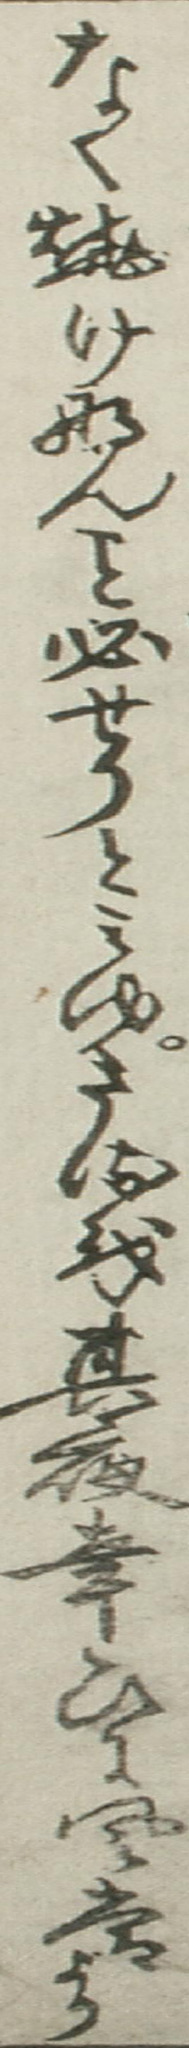なく焼けなんこと必せりとみゆ。さるを其夜幸ひに風常より
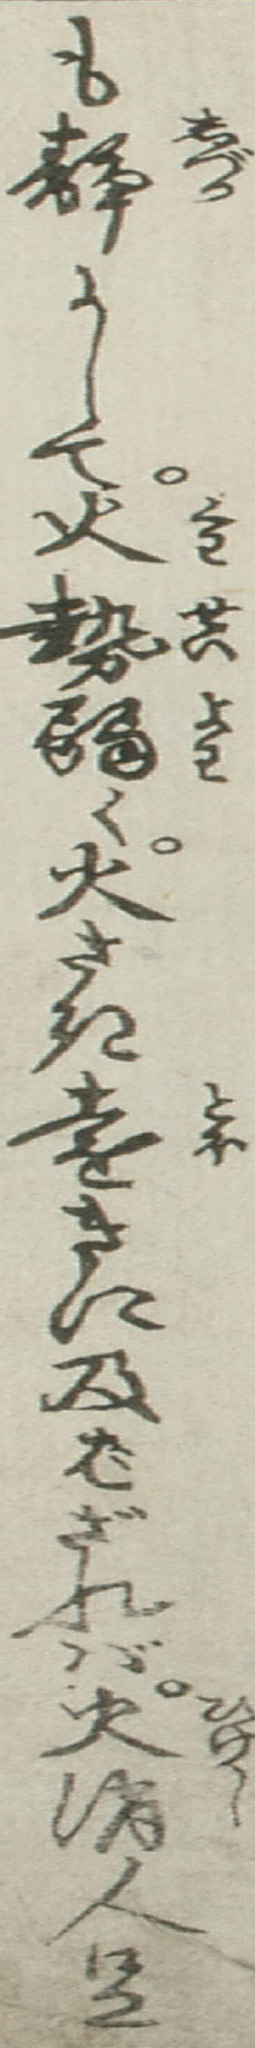も静にして。火勢弱く。火さき遠きに及ばざれば。火消人足
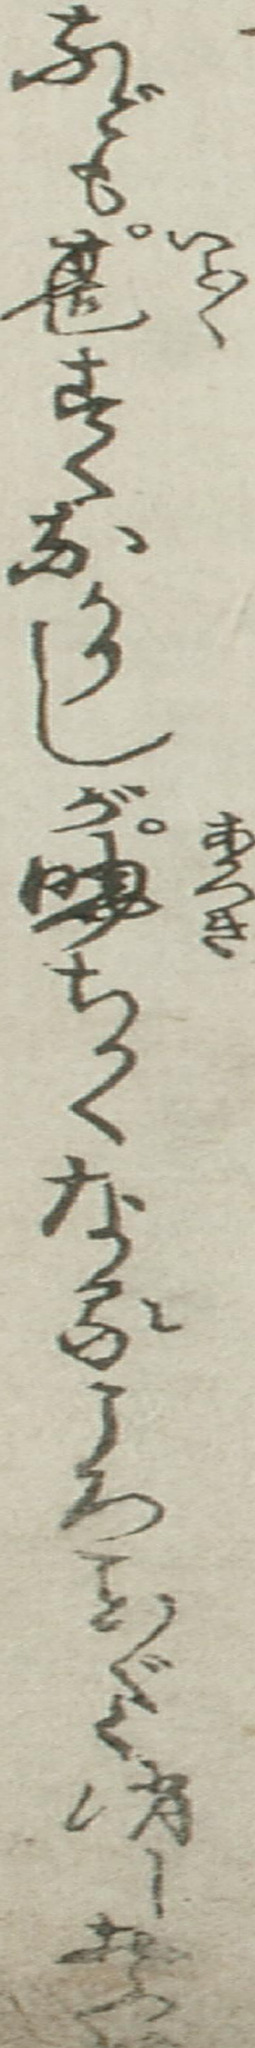なども。甚すくなかりしが。暁ちかくなるころこと〴〵く消しおふせ
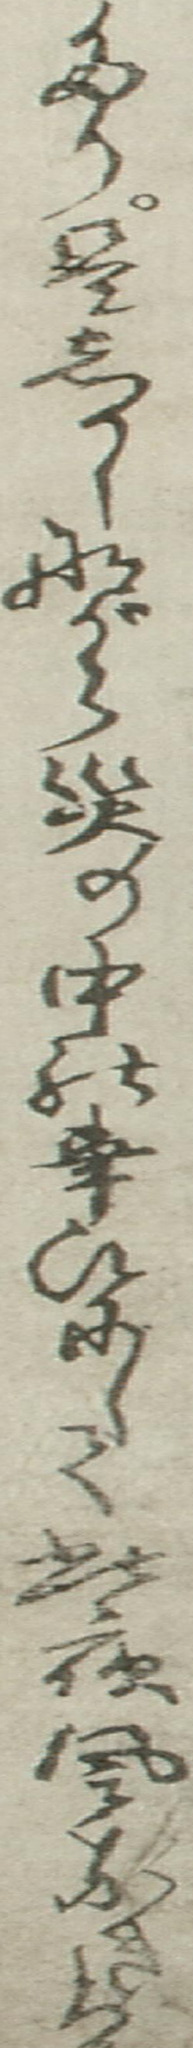たり。是しかしながら災の中の幸ひにして此夜風なきは

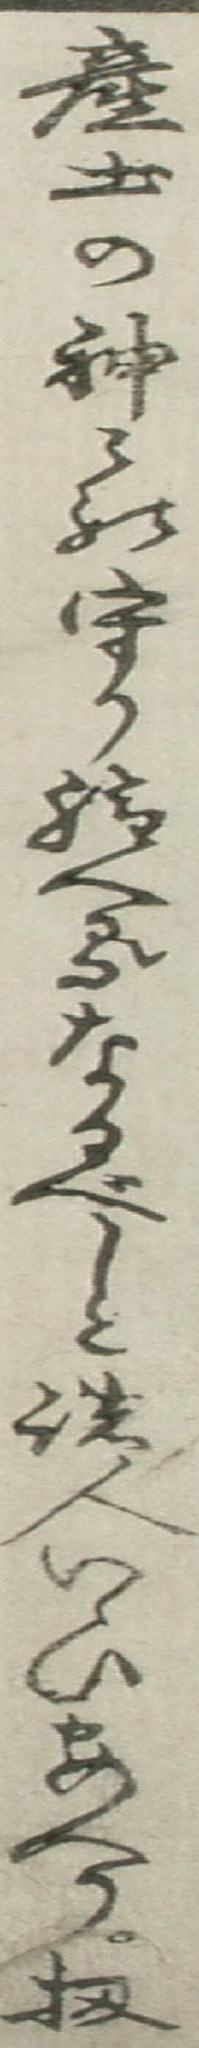産土の神〻の守り給へるなるべしと諸人いひあへり。扨
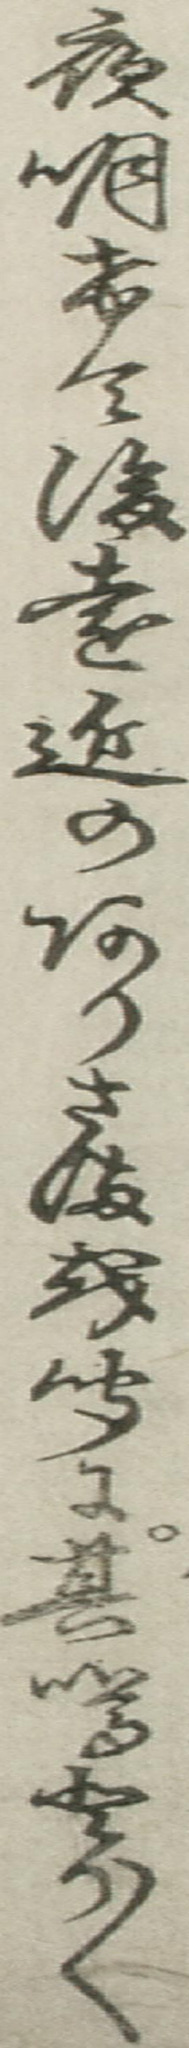夜明けて後。遠近のありさまを聞に。其噂とり〳〵
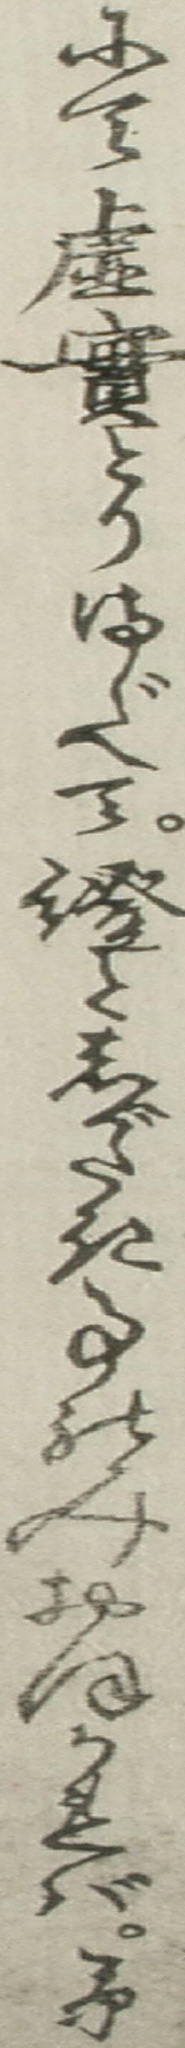にて虚実とりまじへて。證としがたき事のみおほかれば。予
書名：安政見聞誌　上
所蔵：東京大学地震研究所図書室 Earthquake Research Institute Library, The University of Tokyo, JAPAN
